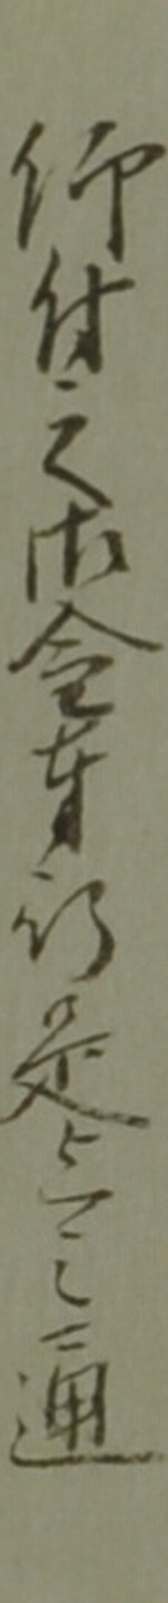仰付之御金奉行是迄之通
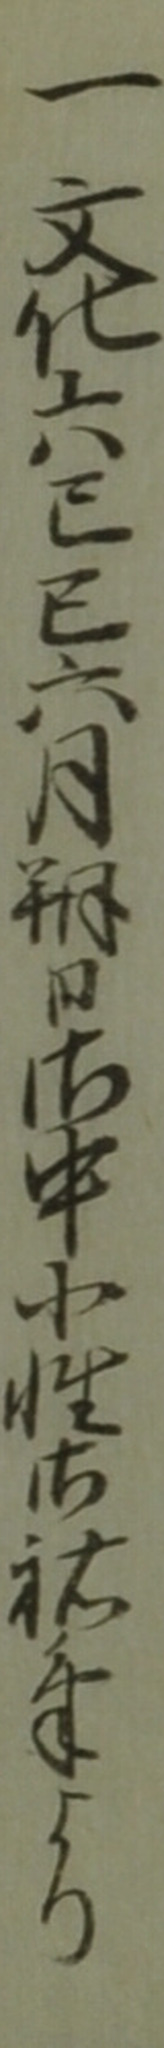一文化六己巳六月朔日御中小姓御祐筆より
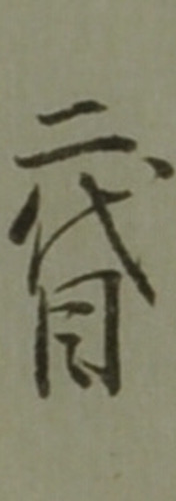二代目
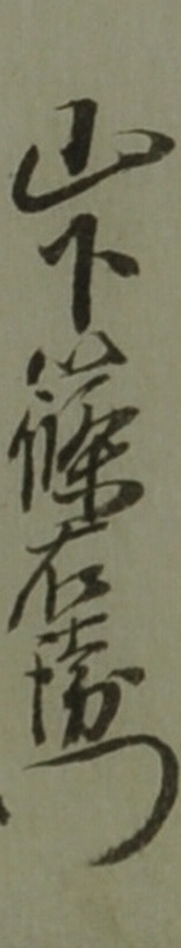山下篠右衛門
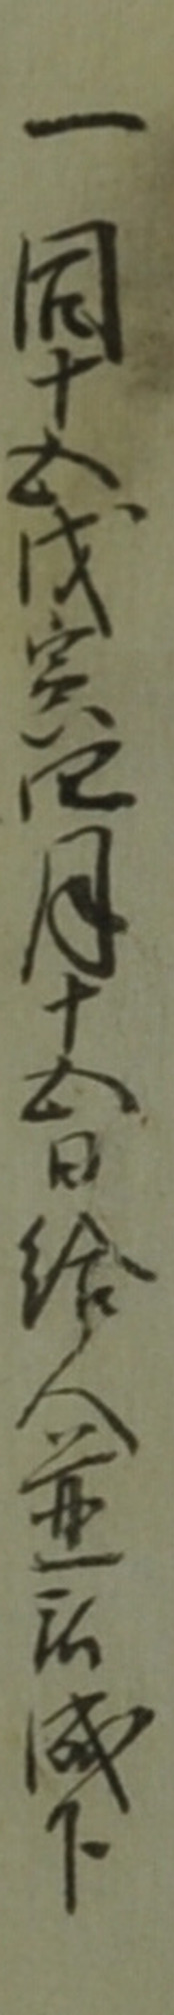一同十五戊寅四月十五日給人並被成下
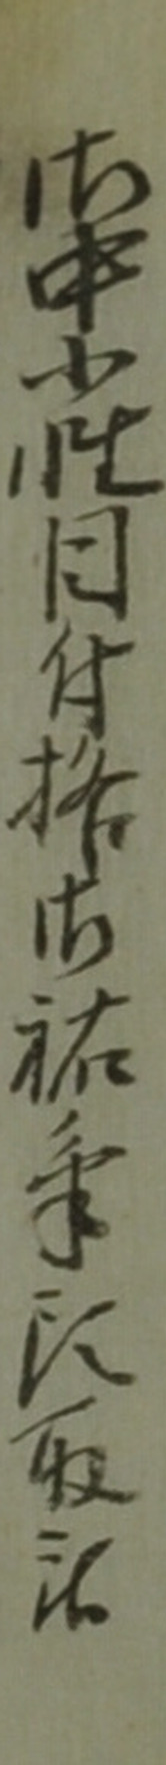御中小姓目付格御祐筆頭取被
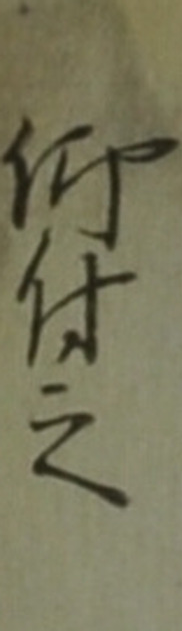仰付之
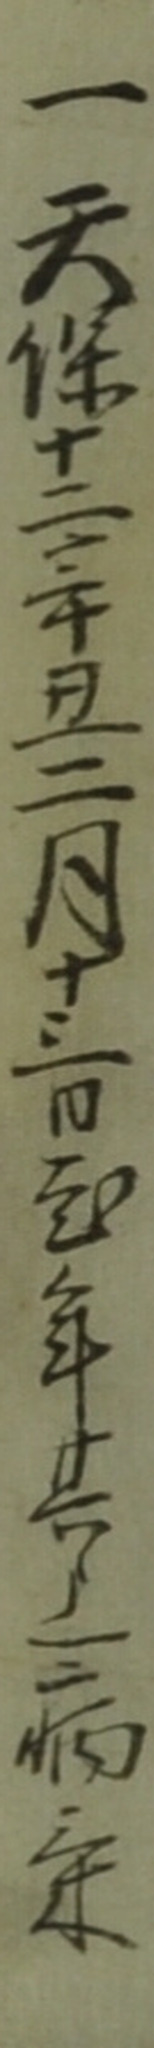一天保十二辛丑二月十三日老年其上病気
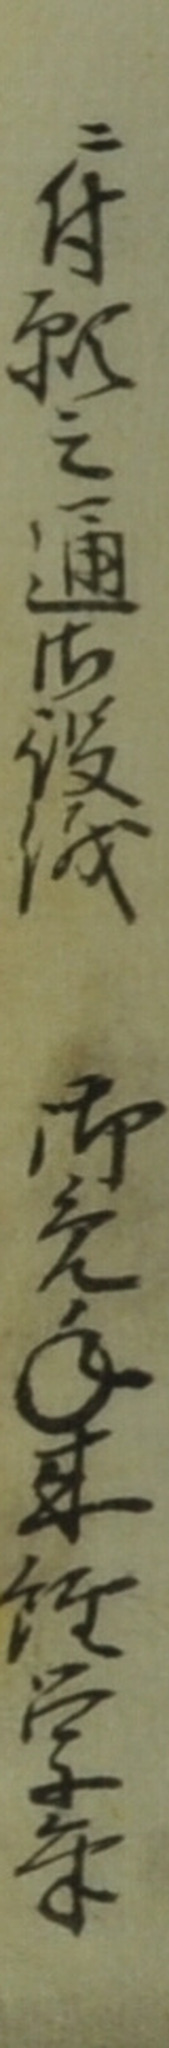に付願之通御役儀御免年来経学筆

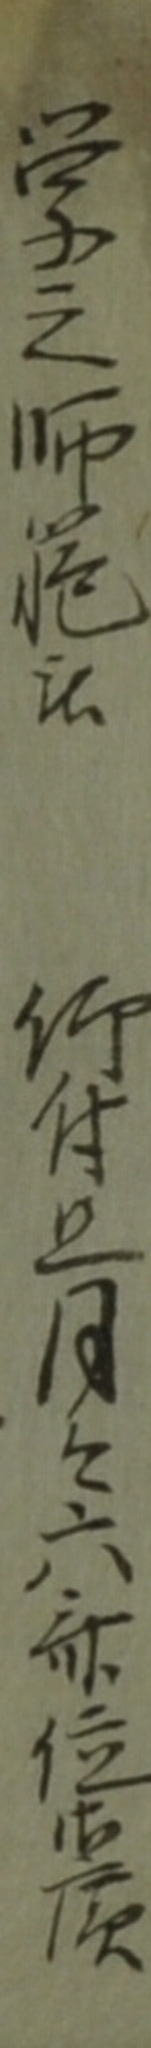学之師範被仰付且月々六齋位御広
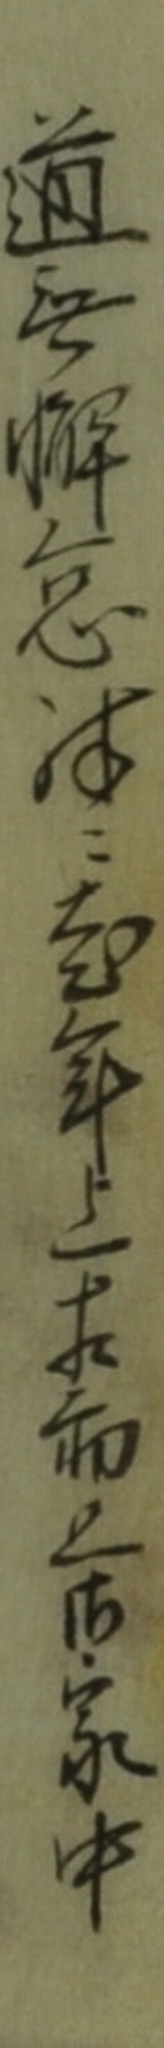道無懈怠殊ニ老年迄相勤且御家中
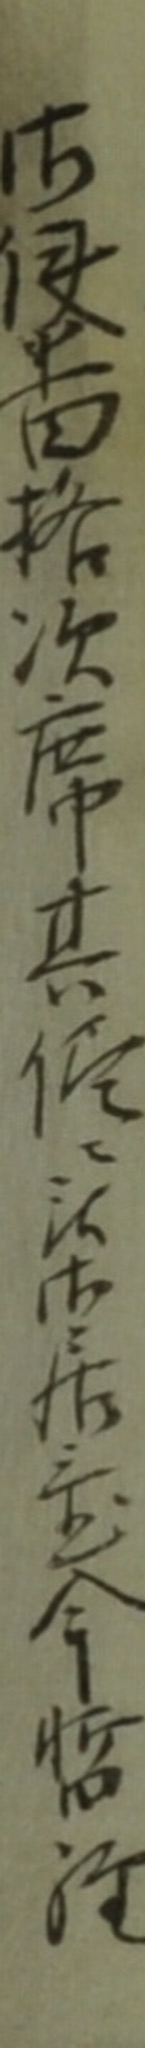御使番格次席其侭ニ被御居置今暫経
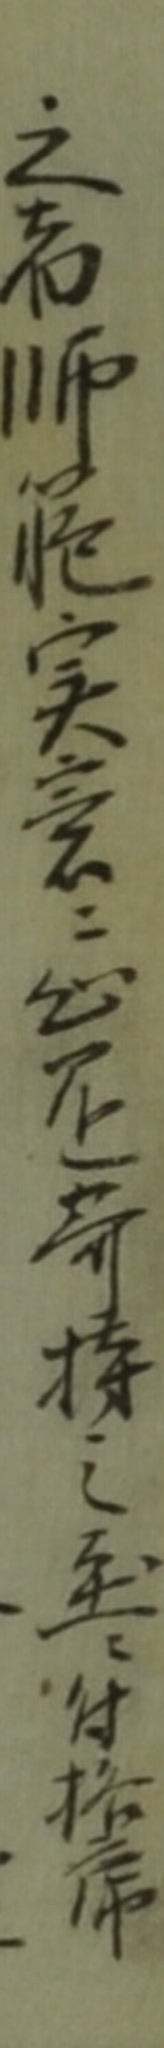之者師範実意ニ心懸寄持之至ニ付格席
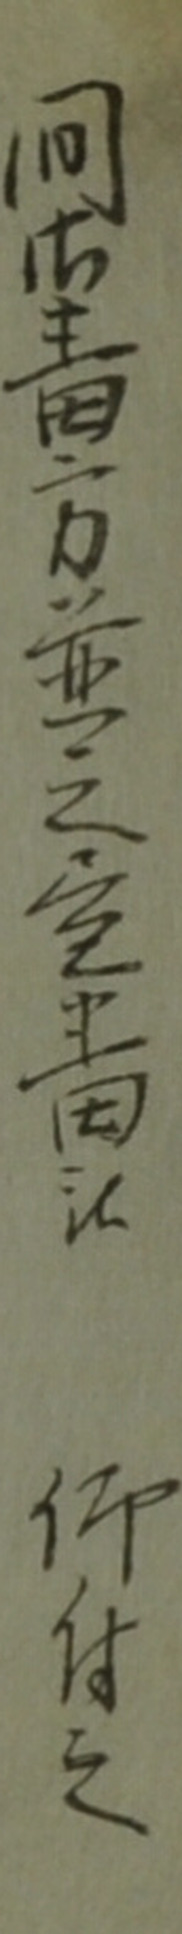間御番方並之昼番被仰付之

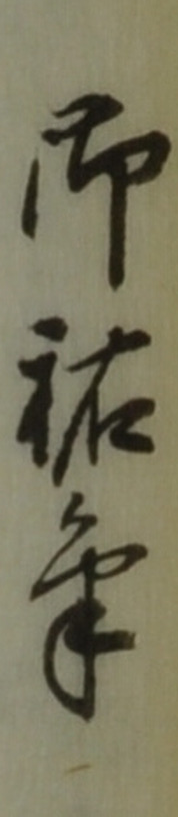御祐筆
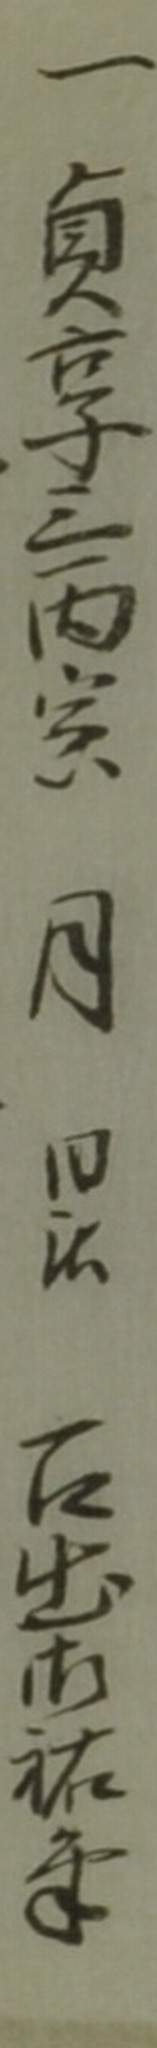一貞享三丙寅月日被召出御祐筆
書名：諸御役代々録（八）
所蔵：伊那市立高遠町図書館・合同会社AMANE
